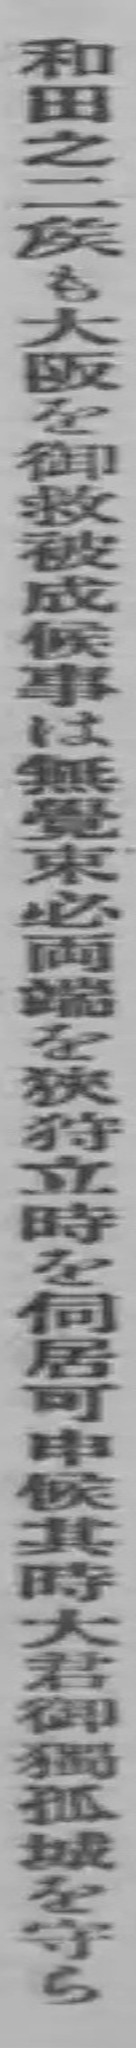和田之二侯も大阪を御救被成候事は無覚束必両端を狭狩立時を伺居可申候其時大君御独孤城を守ら
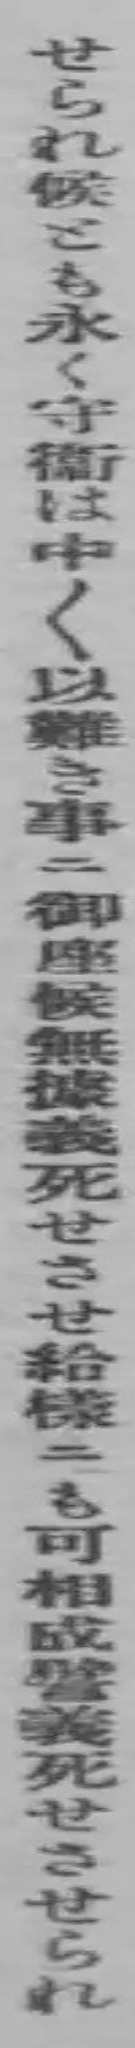せられ候とも永く守衛は中〳〵以難き事ニ御座候無拠義死せさせ給様ニも可相成譬義死せさせられ
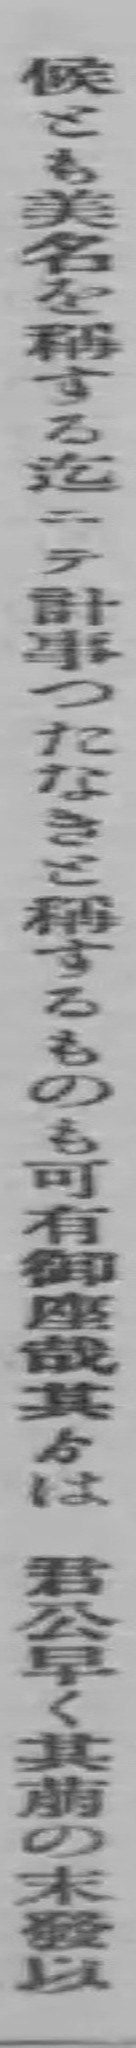候とも美名を称する迄ニて計事つたなきと称するものも可有御座哉其ゟは君公早く其萌の末発以
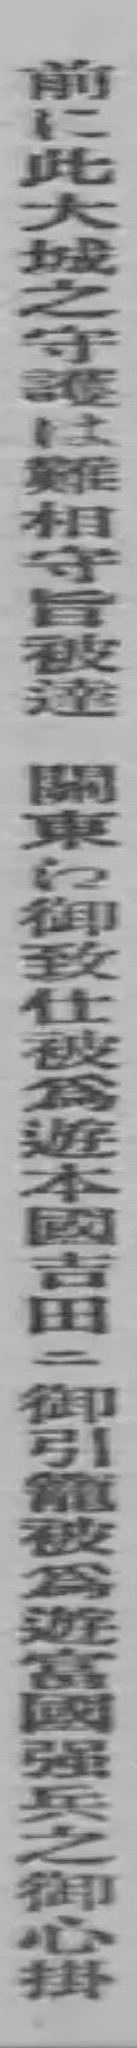前に此大城之守護は難相守旨被達関東え御致仕被為遊本国吉田ニ御引籠被為遊富国強兵之御心掛
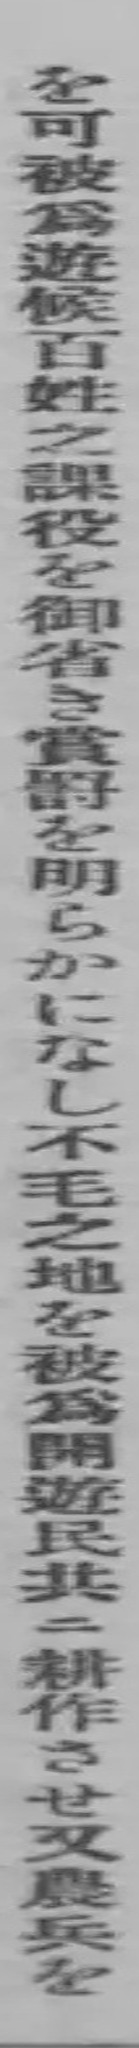を可被為遊候百姓之課役を御省き賞罰を明らかになし不毛之地を被為開遊民共ニ耕作させ又農兵を
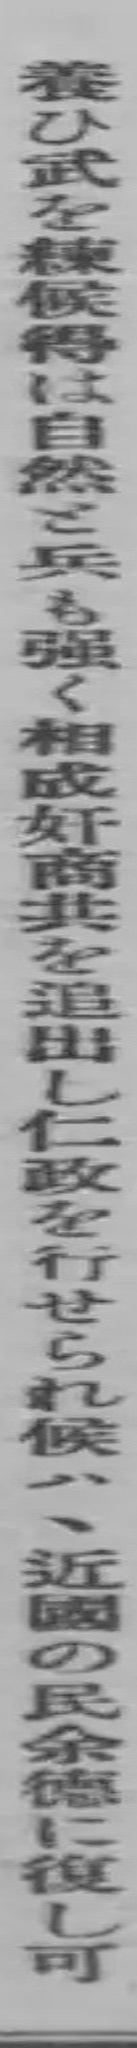養ひ武を練候得は自然と兵も強く相成奸商共を追出し仁政を行せられ候はゝ近国の民余徳に復し可
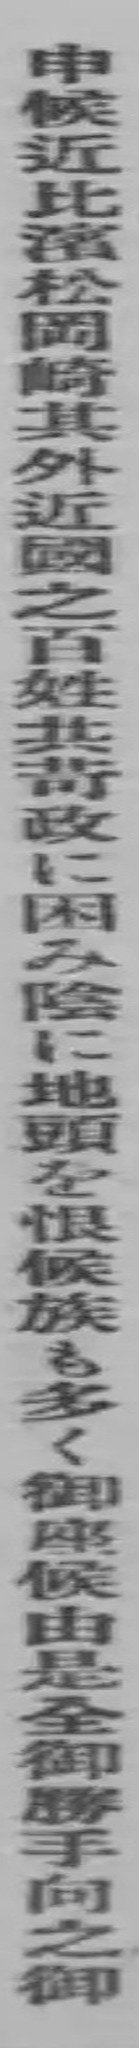申候近比浜松岡崎其外近国之百姓共苛政に困み陰に地頭を恨候族も多く御座候由是全御勝手向之御
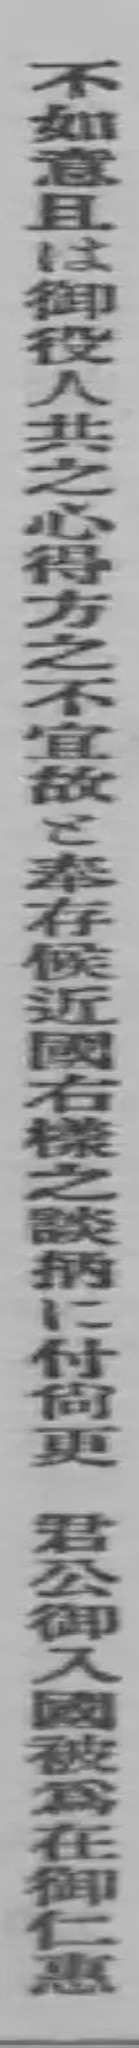不如意且は御役人共之心得方之不宜故と奉存候近国右様之談柄に付尚更君公御入国被為在御仁恵
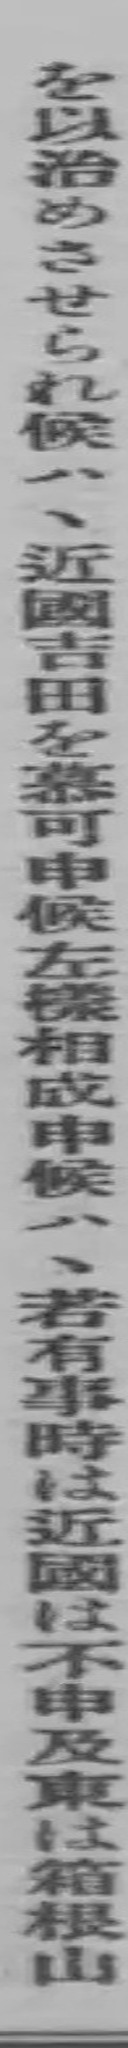を以治めさせられ候はゝ近国吉田を慕可申候左様相成申候はゝ若有事時は近国は不申及東は箱根山
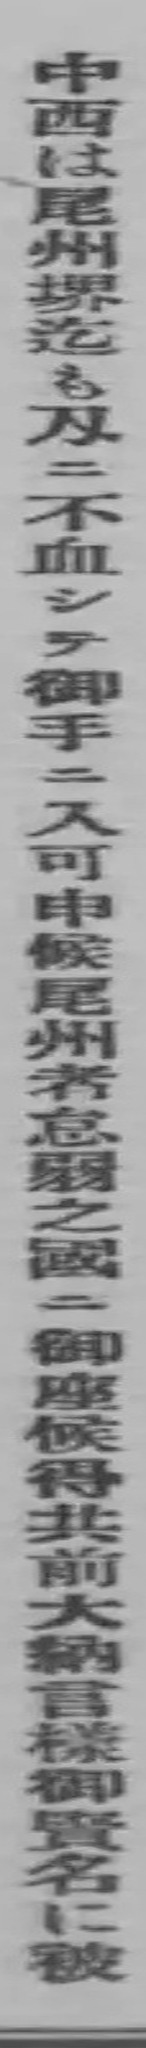中西は尾州堺迄も刃ニ不血して御手ニ入可申候尾州者怠弱之国ニ御座候得共前大納言様御賢名に被
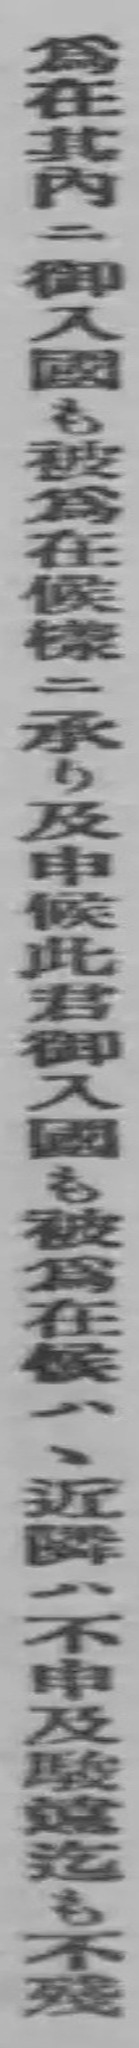為在其内ニ御入国も被為在候様ニ承り及申候此君御入国も被為在候はゝ近隣は不申及駿遠迄も不残
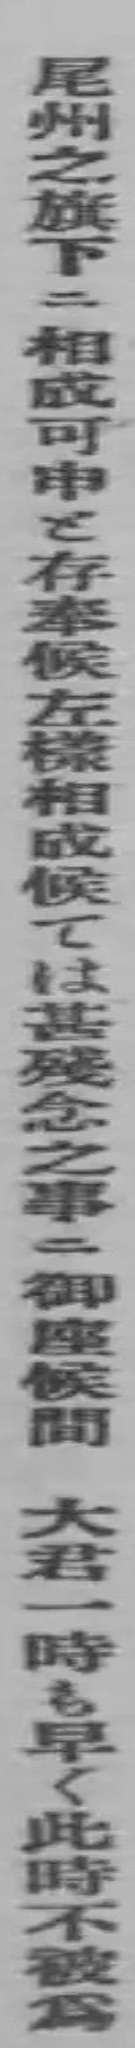尾州之旗下ニ相成可申と存奉候左様相成候ては甚残念之事ニ御座候間大君一時も早く此時不被為

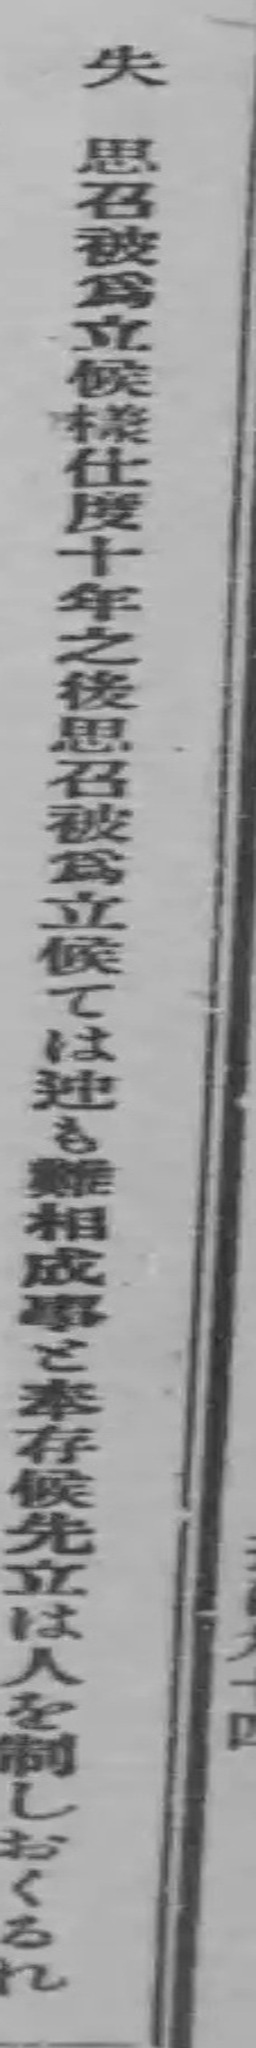失思召被為立候様仕度十年之後思召被為立候ては迚も難相成事と奉存候先立は人を制しおくるれ
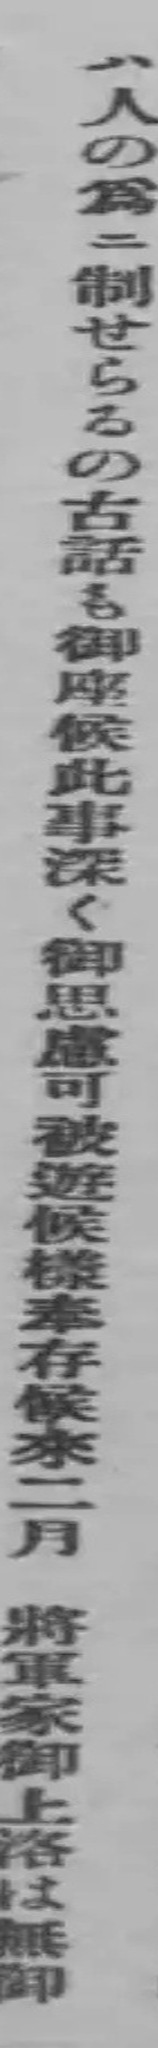は人の為ニ制せらるの古語も御座候此事深く御思慮可被遊候様奉存候来二月将軍家御上洛は無御
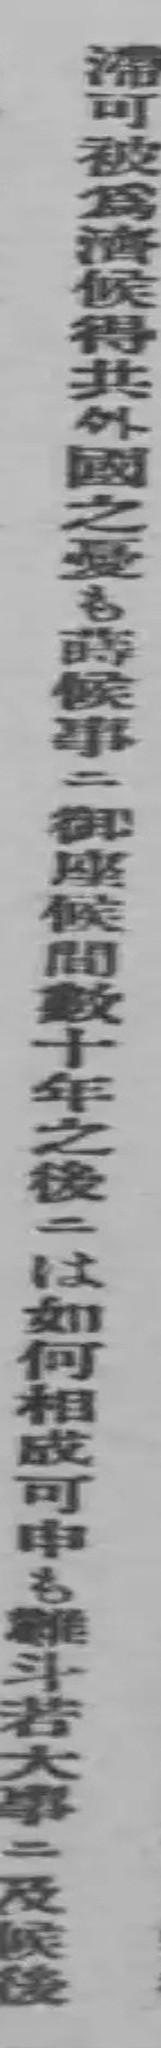滞可被為済候得共外国之憂も蒔候事ニ御座候間数十年之後ニは如何相成可申も難斗若大事ニ及候後
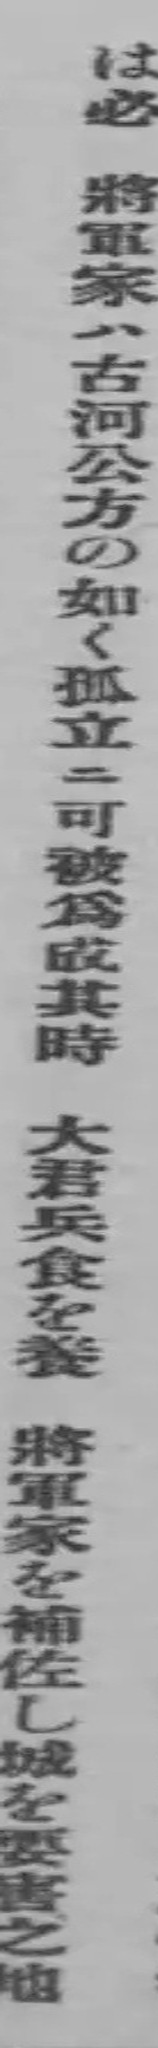は必将軍家は古河公方の如く孤立ニ可被為成其時大君兵食を養将軍家を補佐し城を要害之地
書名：豊橋市史談
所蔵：国立国会図書館 National Diet Library, JAPAN
